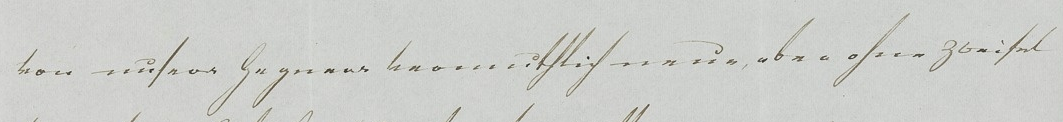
von unsern Gegnern vermuthlich neue, aber ohne Zweifel
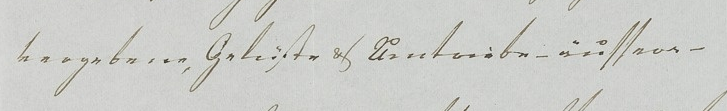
vergebene, Gelüste & Umtrieben äussern.
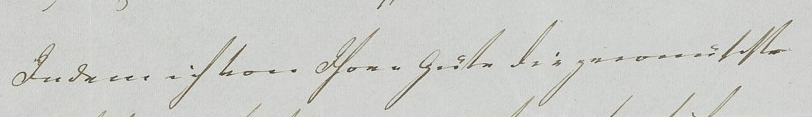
Indem ich von Ihrer Güte die gewünschte
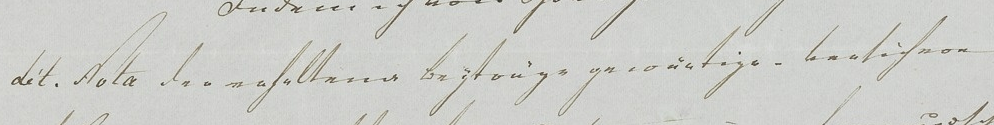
dit. Nota der erhaltenen Beyträge gewärtige – versichere
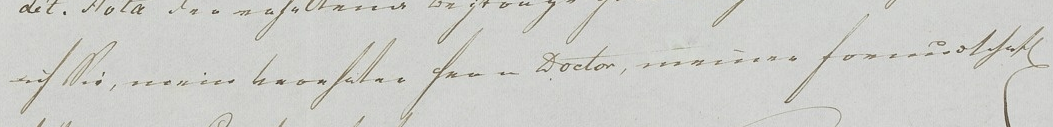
ich Sie, mein verehrter Herr Doctor, meiner freundschaftlichsten
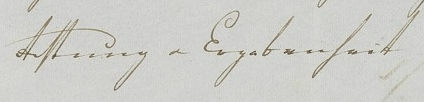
Achtung & Ergebenheit
